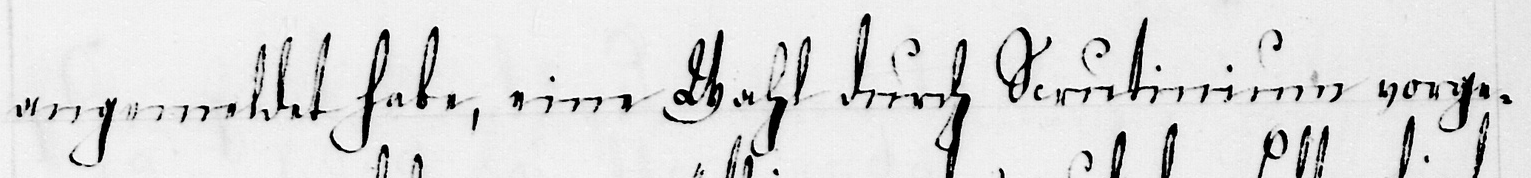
angemeldet habe, eine Wahl durch Scrutinium vorge¬
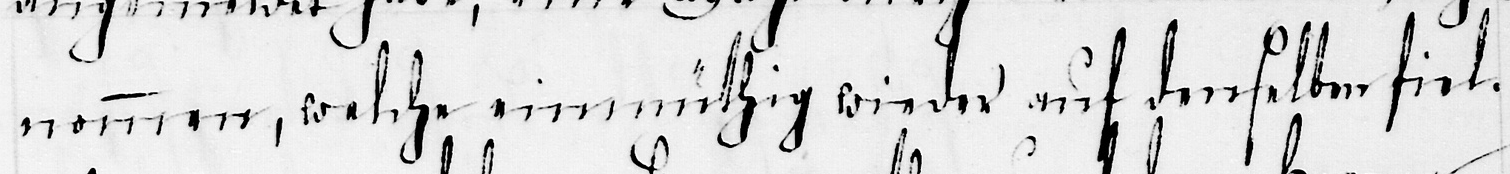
nommen, welche einmüthig wieder auf denselben fiel.
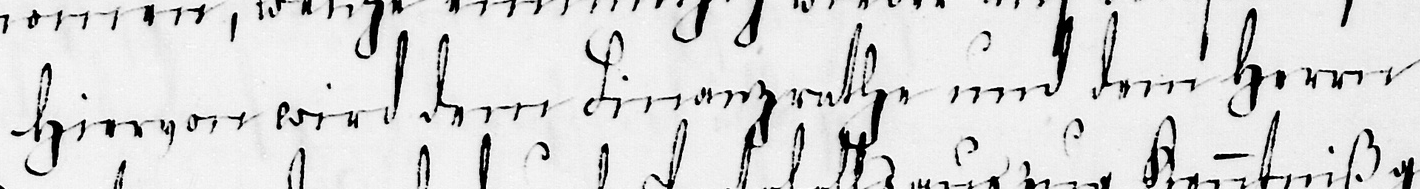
Hiervon wird dem Finanzrathe und dem Herrn
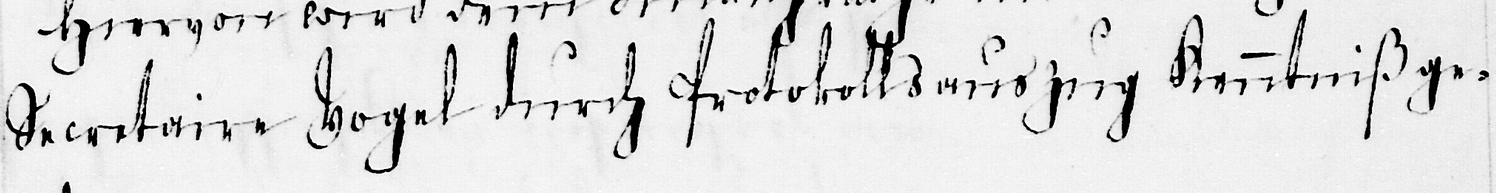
Secretaire Vogel durch Protokollsauszug Kenntniß ge¬
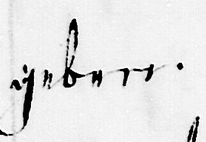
geben.
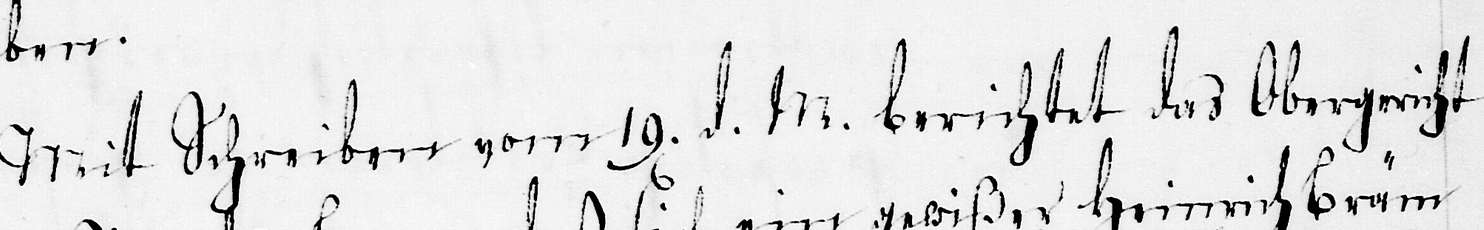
Mit Schreiben vom 19. d. M. berichtet das Obergericht
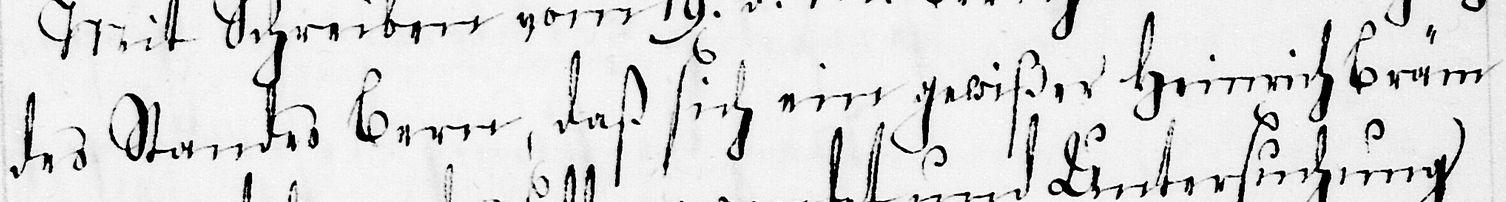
des Standes Bern, daß sich ein gewißer Heinrich Bräm
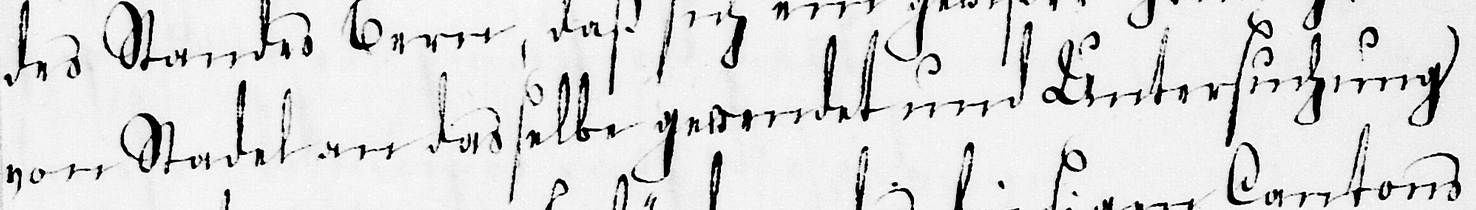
von Stadel an dasselbe gewendet und Untersuchung
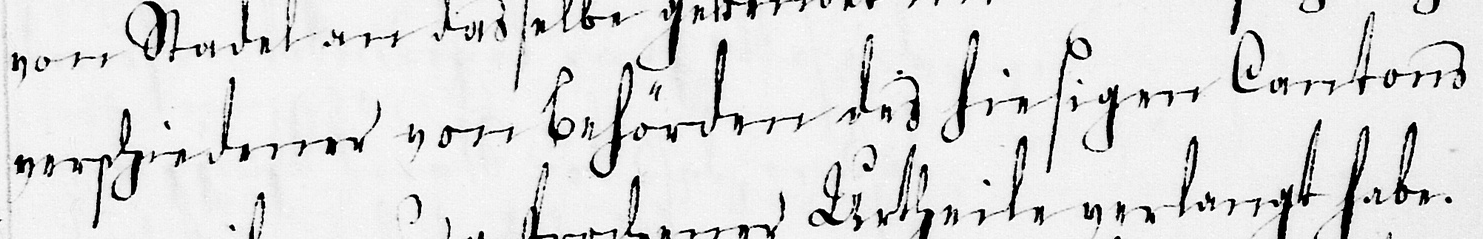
verschiedener von Behörden des hiesigen Cantons
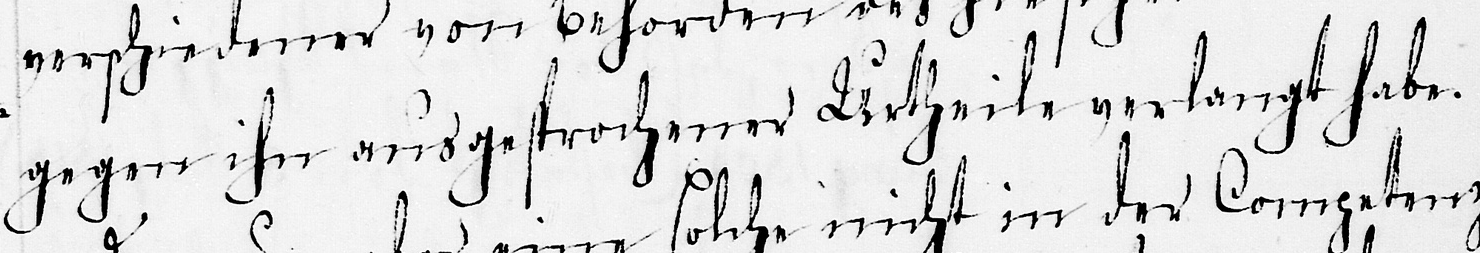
gegen ihn ausgesprochener Urtheile verlangt habe.
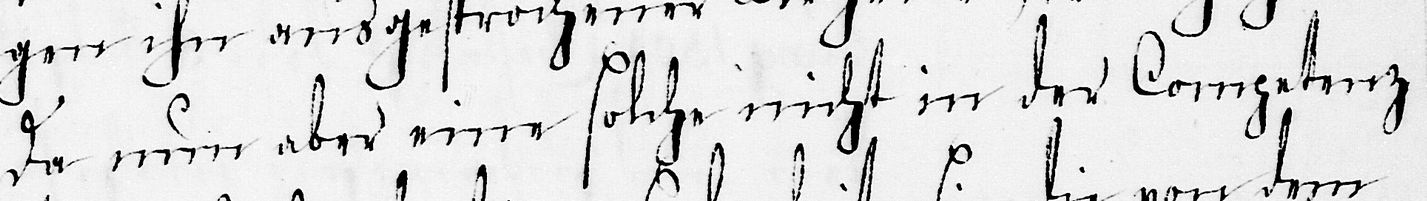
Da nun aber eine solche nicht in der Competenz
